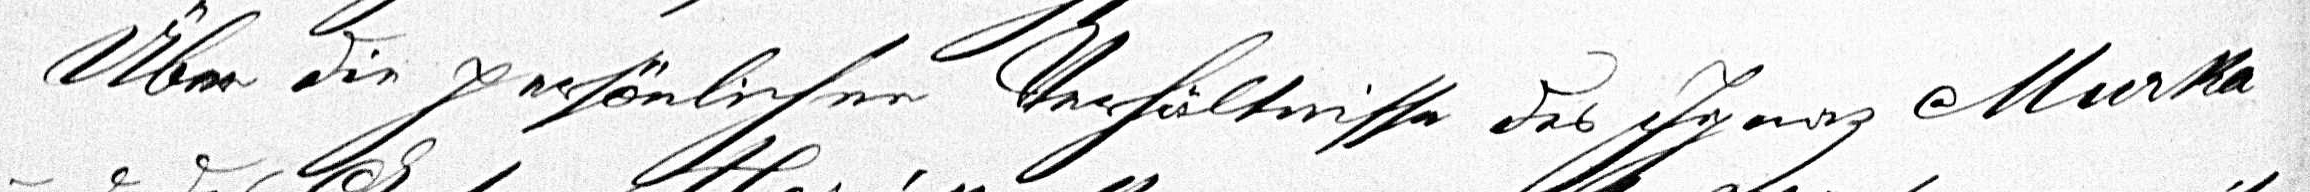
Über die persönlichen Verhältnisse des Ignaz Murka
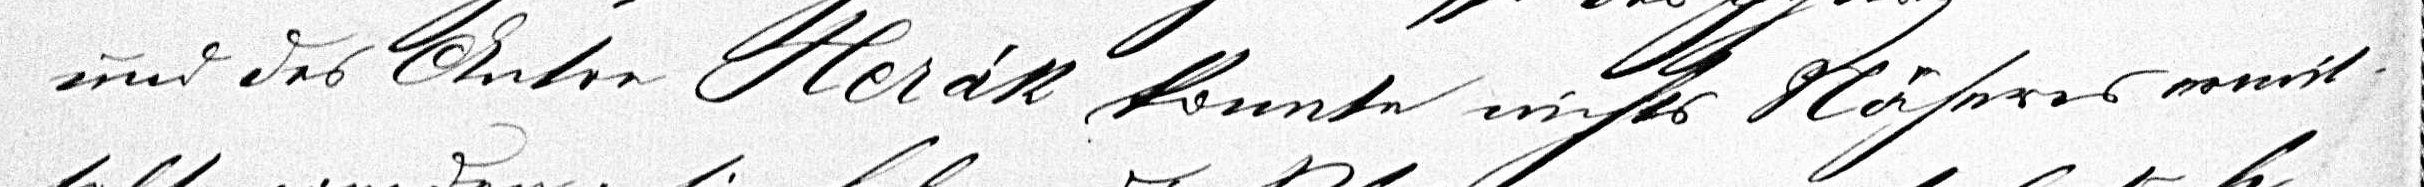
und des Anton Herák konnte nichts Näheres ermit¬
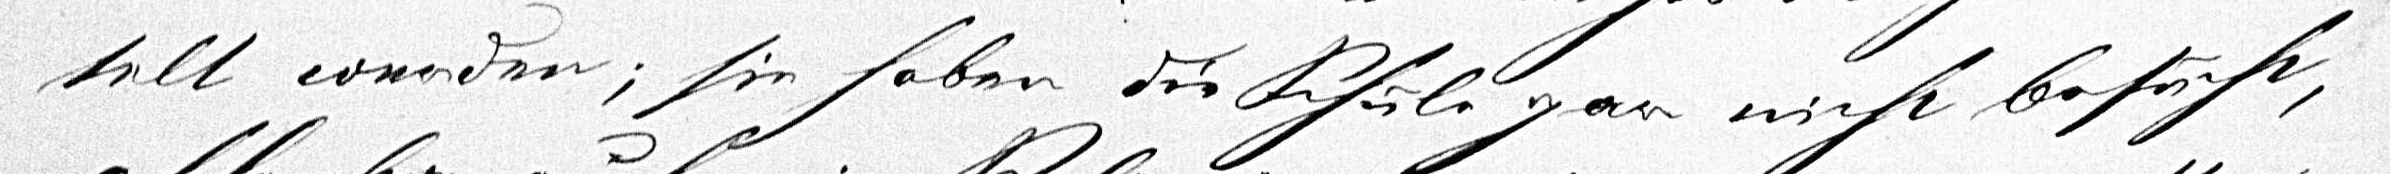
telt werden; sie haben die Schule gar nicht besucht,
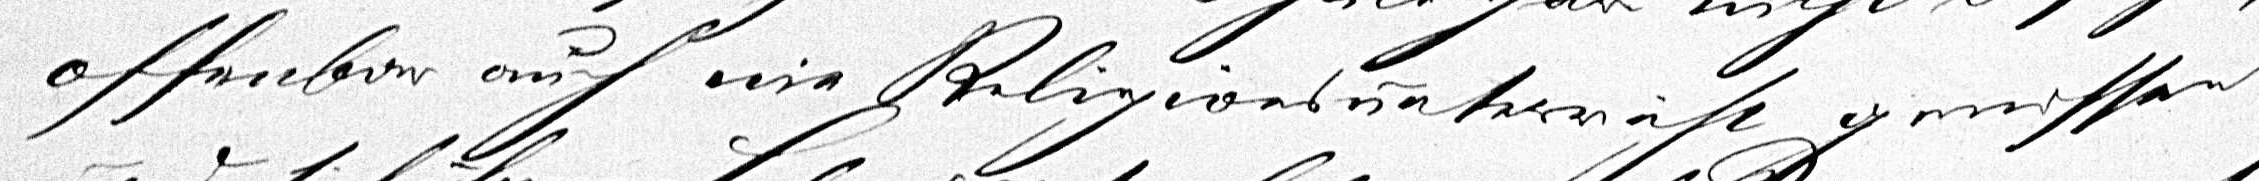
offenbar auch nie Religionsunterreicht genossen
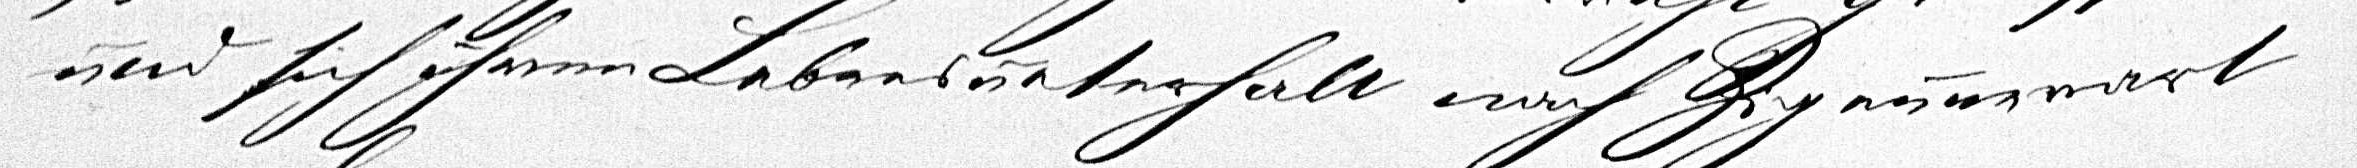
und sich ihren Lebensunterhalt nach Zigeunerart
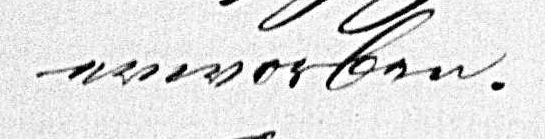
erworben.
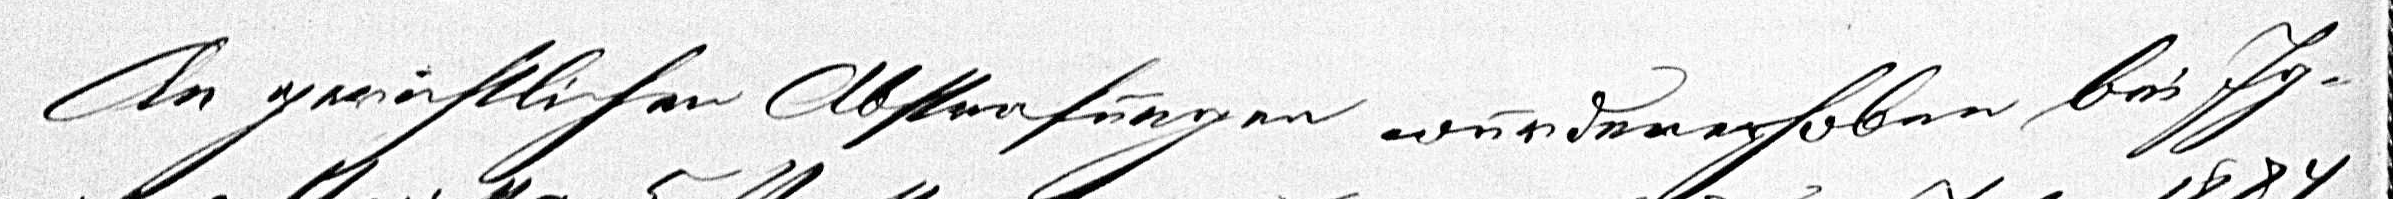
An gerichtlichen Abstrafungen wurden erhoben bei Ig¬
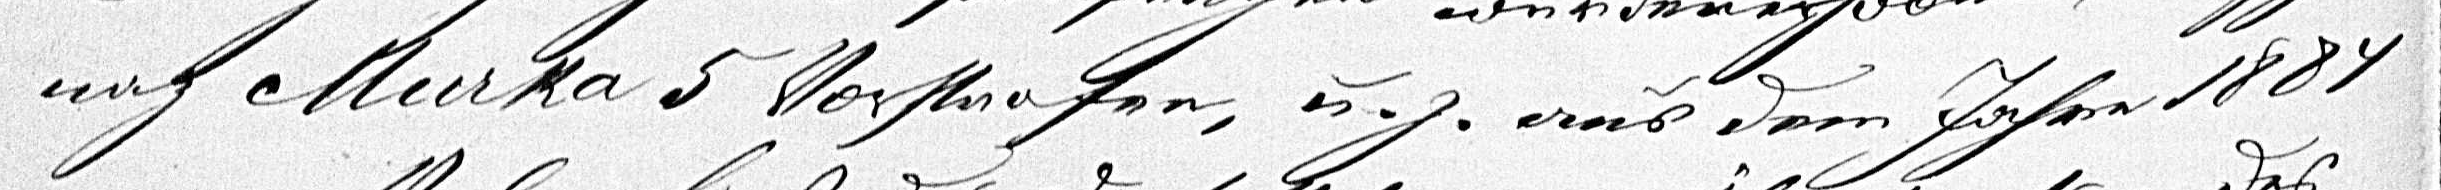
naz Murka 5 Vorstrafen, u.z. aus dem Jahre 1884
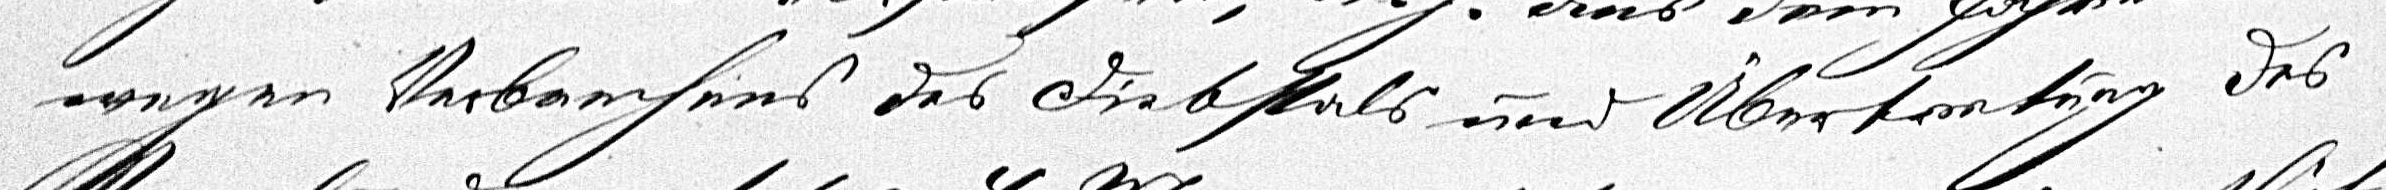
wegen Verbrenchens des Diebstals und Übertretung des
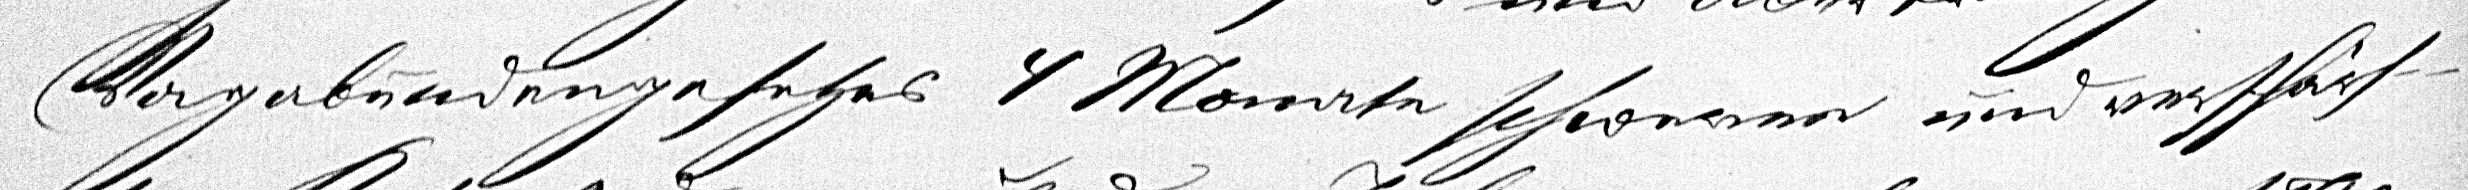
Vagabundengesetzes 4 Monate schweren und verschärf¬
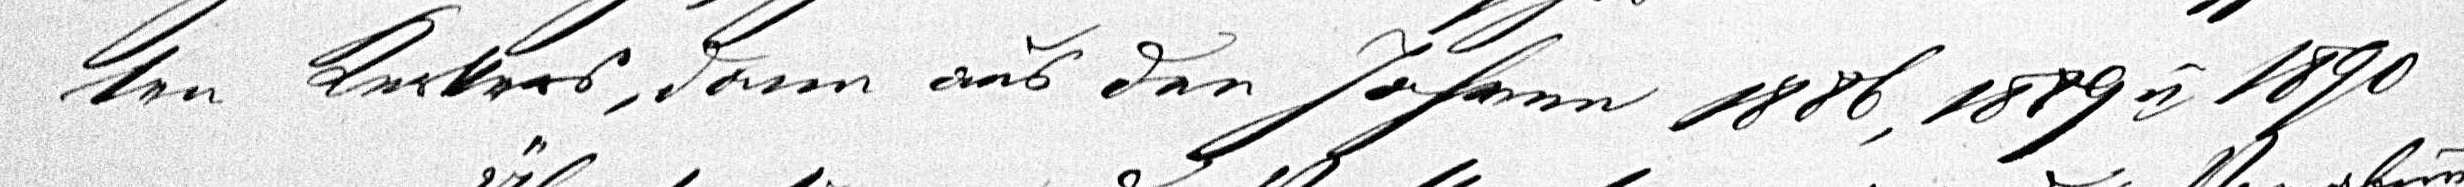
ten Kerkers, dann aus den Jahren 1886, 1889 u 1890
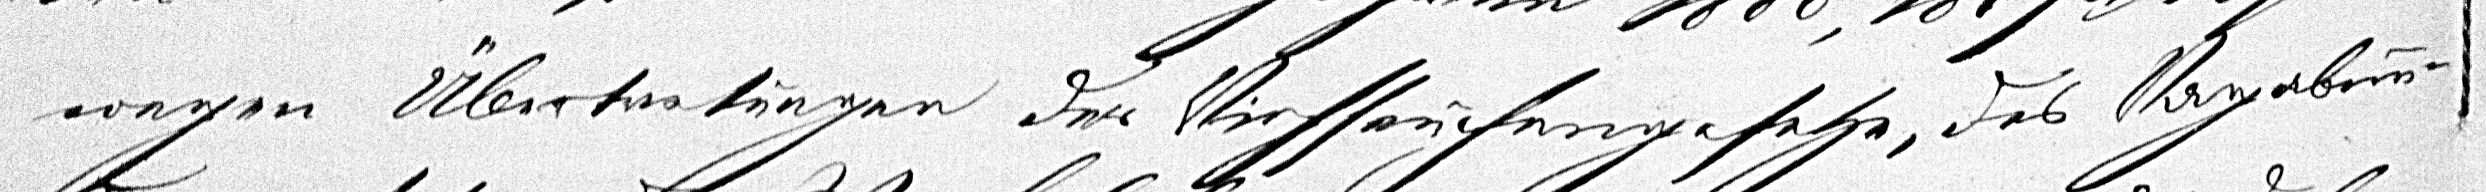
wegen Übertretungen der Viehseuchengesetze, des Vagabun¬
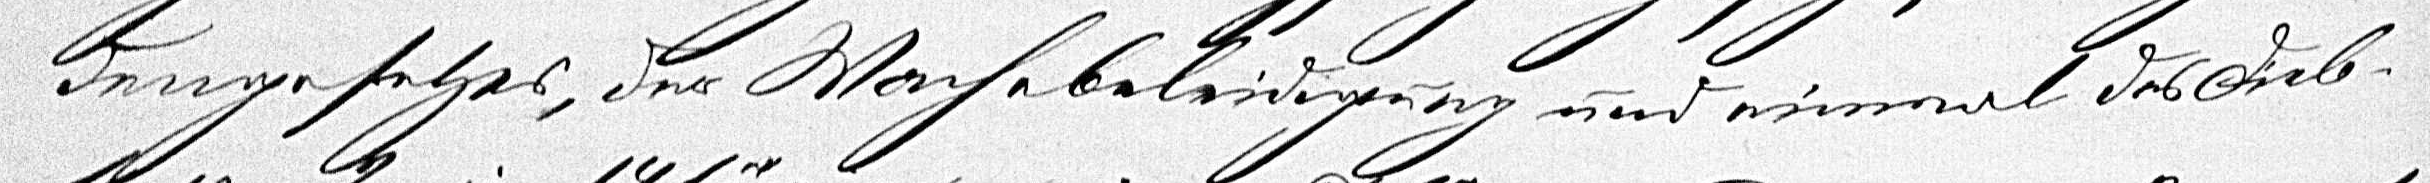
dengesetzes, der Wachebeleidigung und einmal des Dieb¬
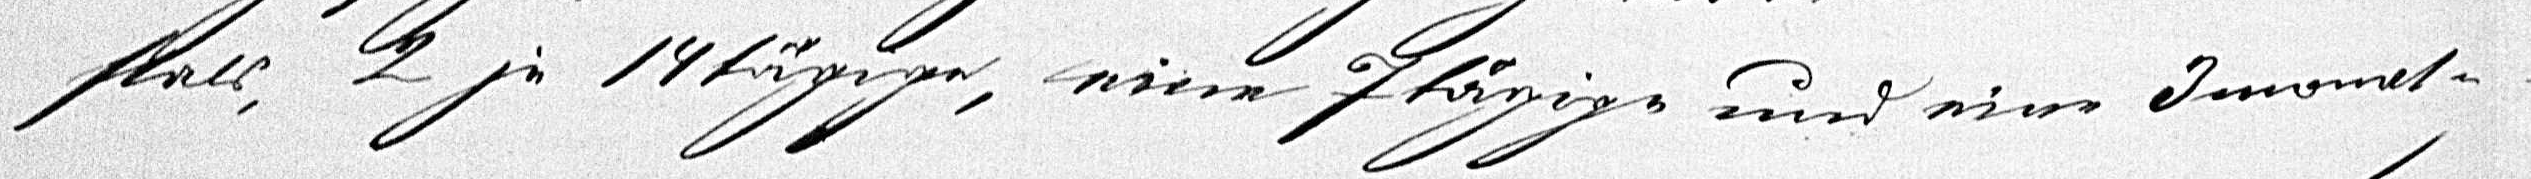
stals, 2 je 14tägigen, eine 7tägige und eine 3monat¬
